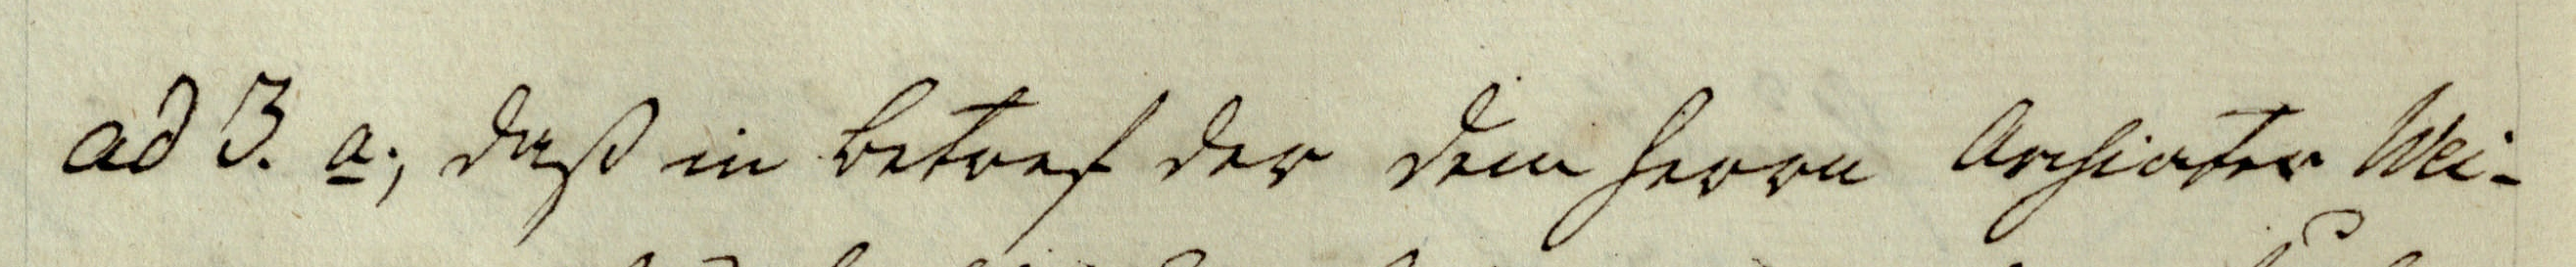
ad 3. a., daß in Betref der dem Herrn Archiater Wei¬
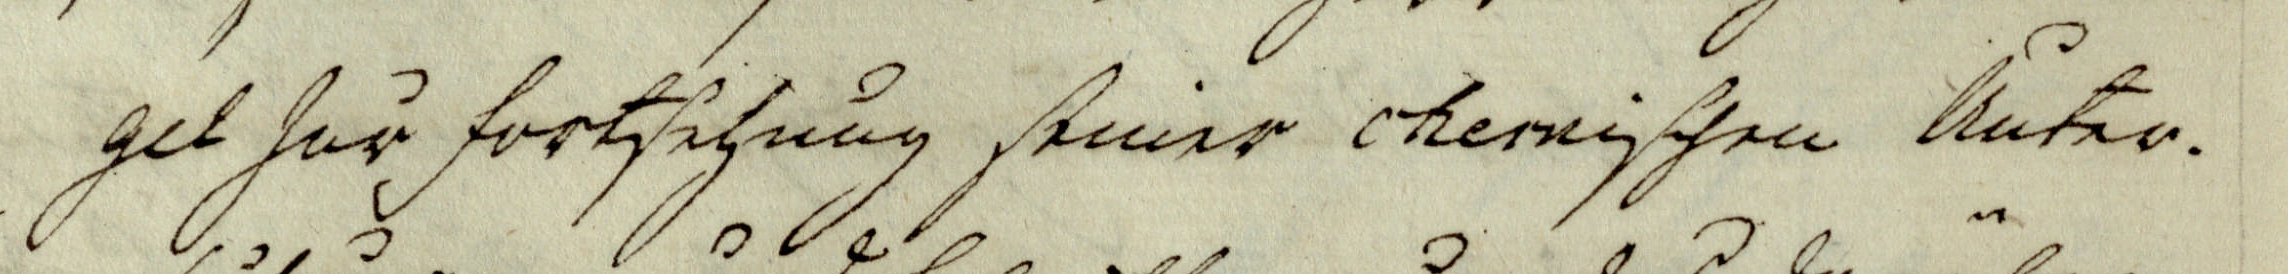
gel zur Fortsetzung seiner chemischen Unter¬
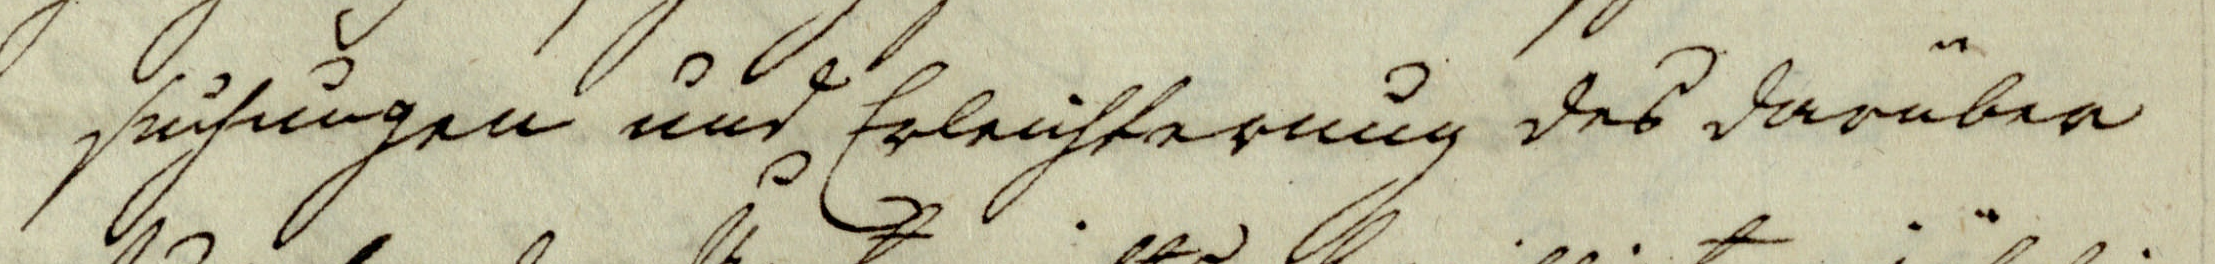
suchungen und Erleichterung des darüber
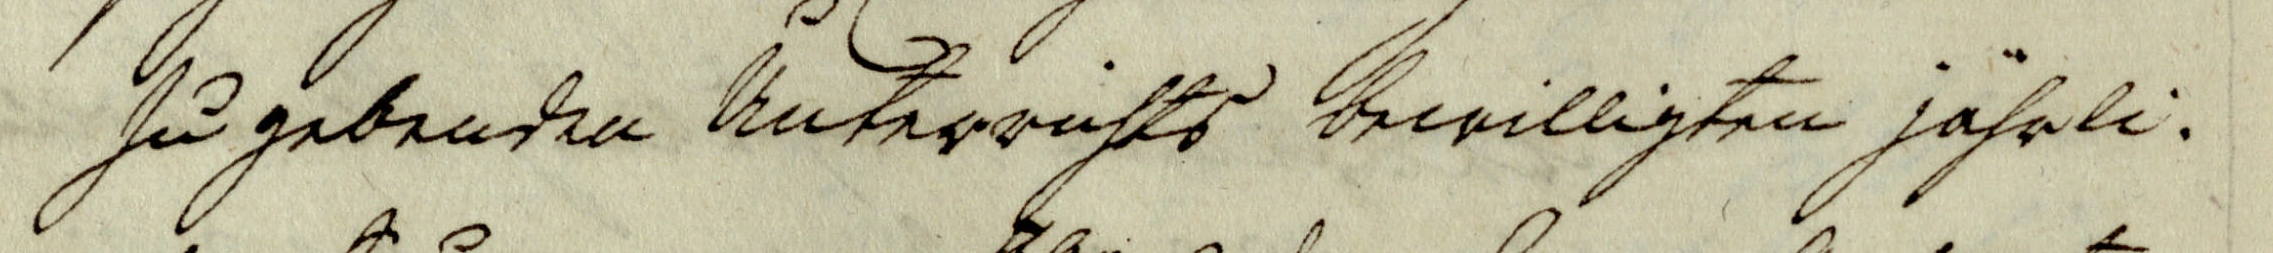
zu gebenden Unterrichts bewilligten jährli¬
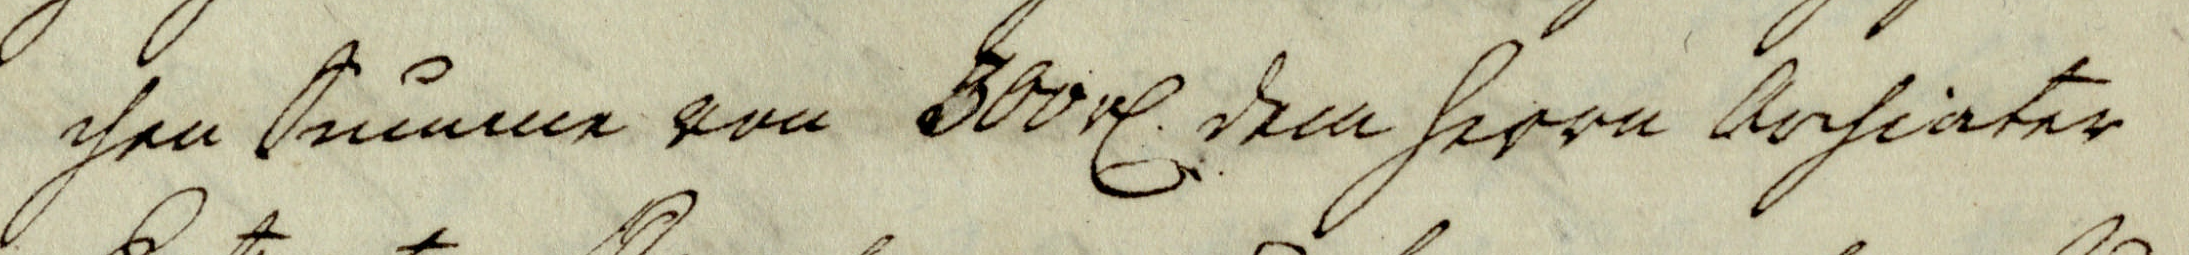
chen Summe von 300 l. dem Herrn Archiater
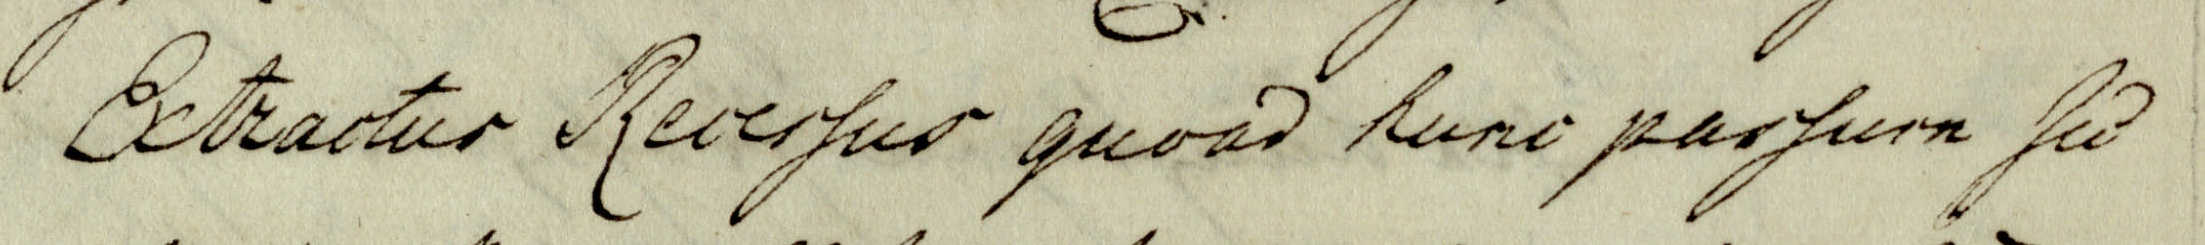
Extractus Recessus quoad hunc passum zu
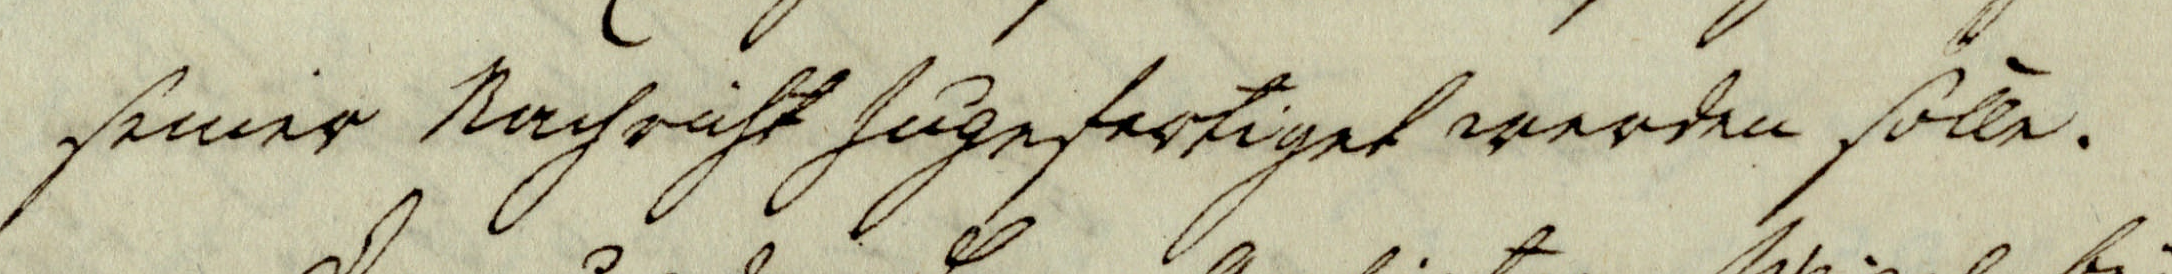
seiner Nachricht zugefertiget werden solle.
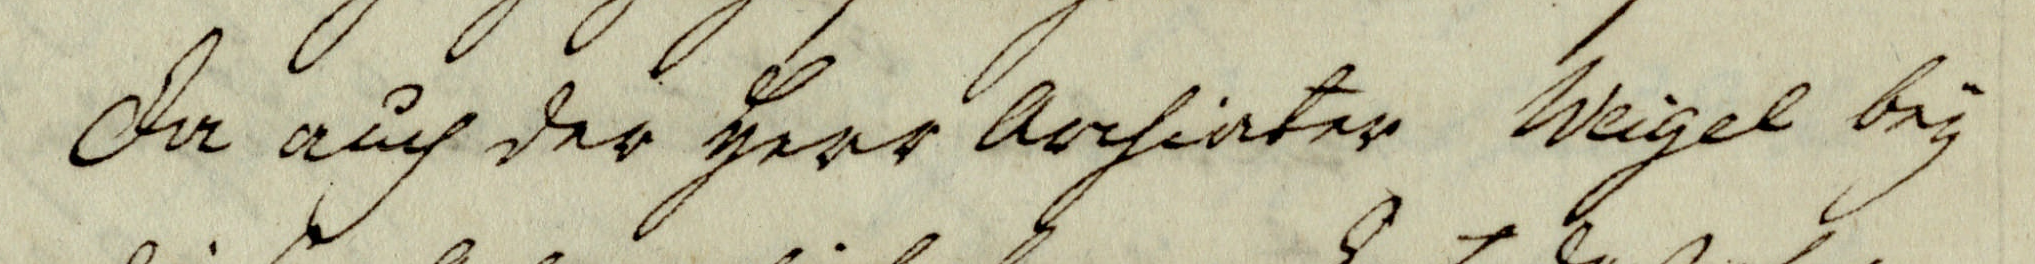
Da auch der Herr Archiater Weigel beÿ
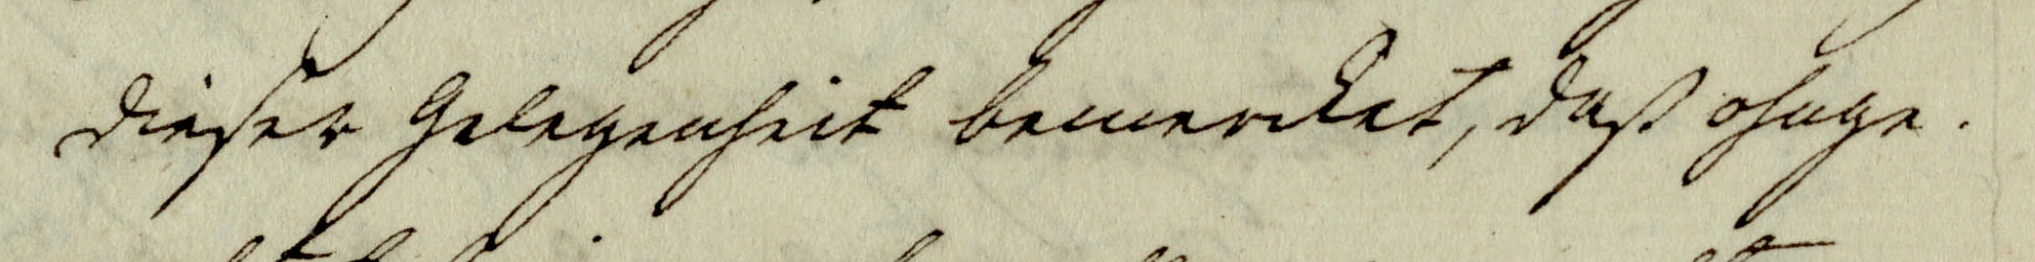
dieser Gelegenheit bemerket, daß ohnge¬
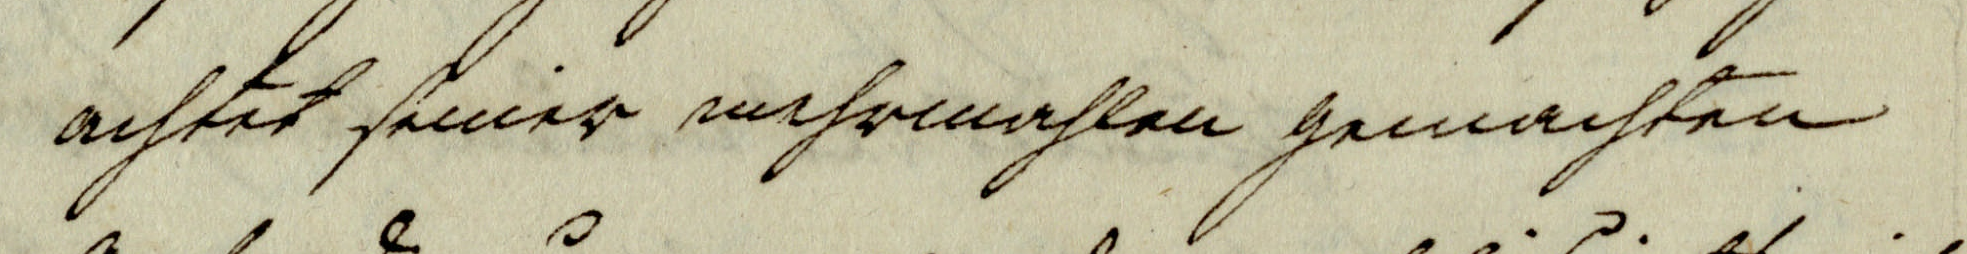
achtet seiner mehrmahlen gemachten
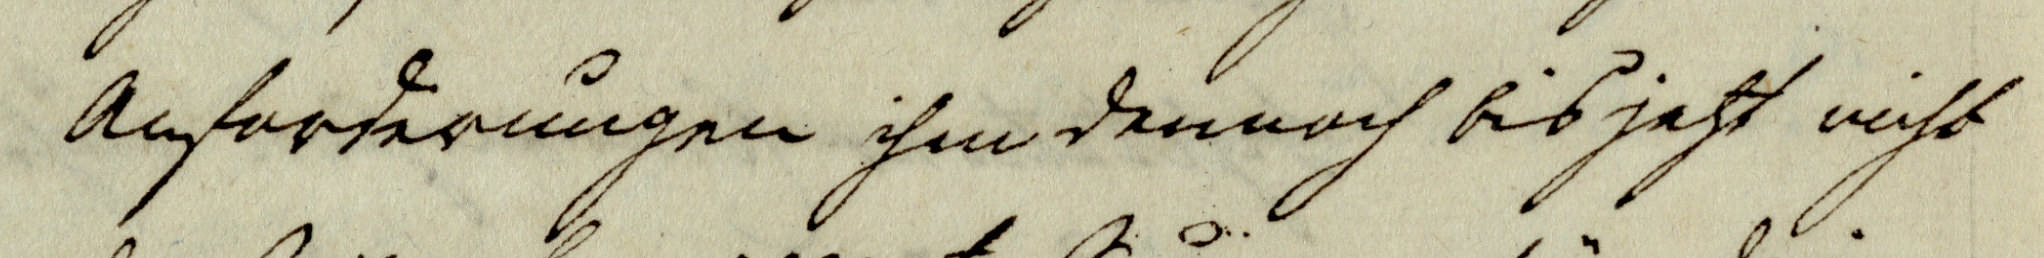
Anforderungen ihm dennoch bis jetzt nicht
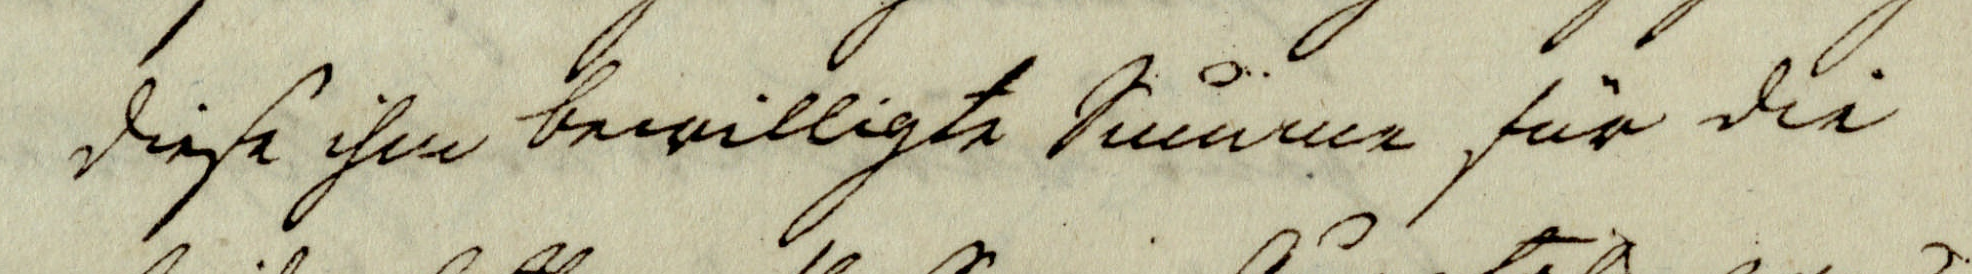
diese ihm bewilligte Summe für die
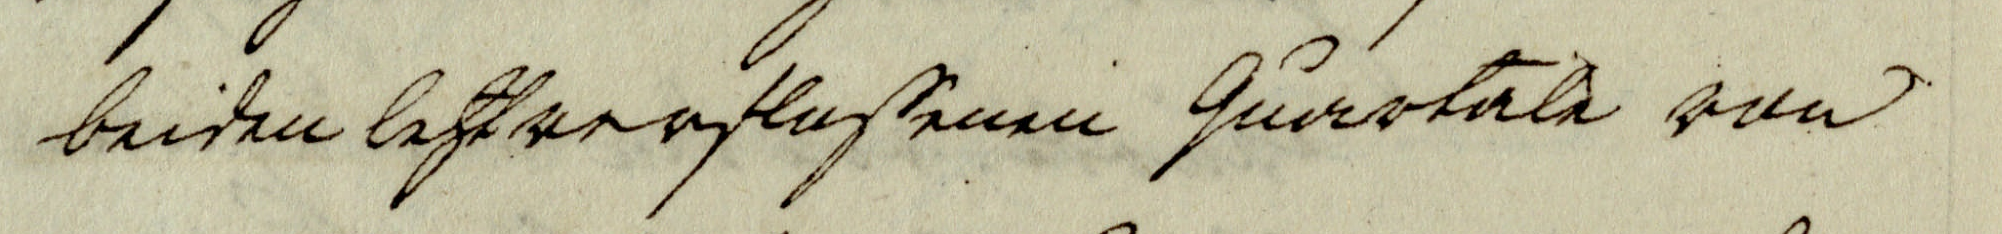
beiden letzt verflossenen Quartale von
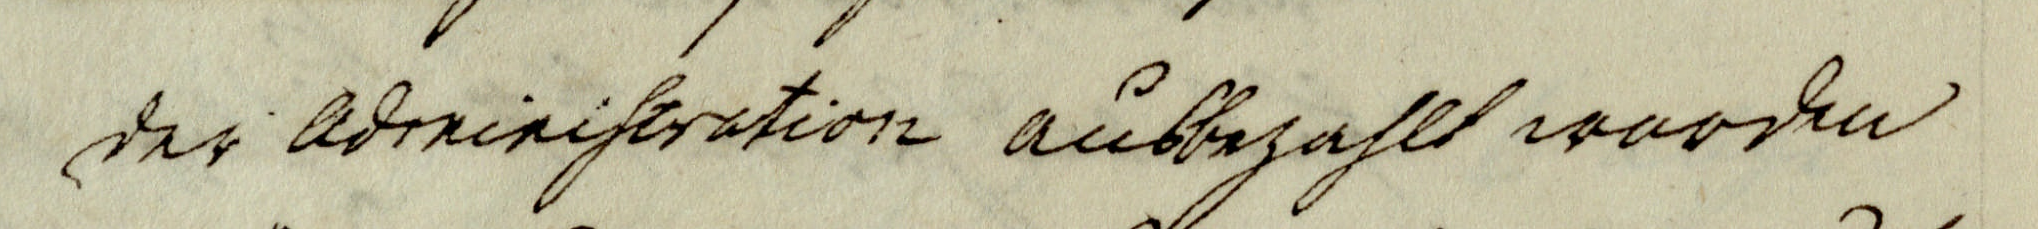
der Administration ausbezahlt worden
